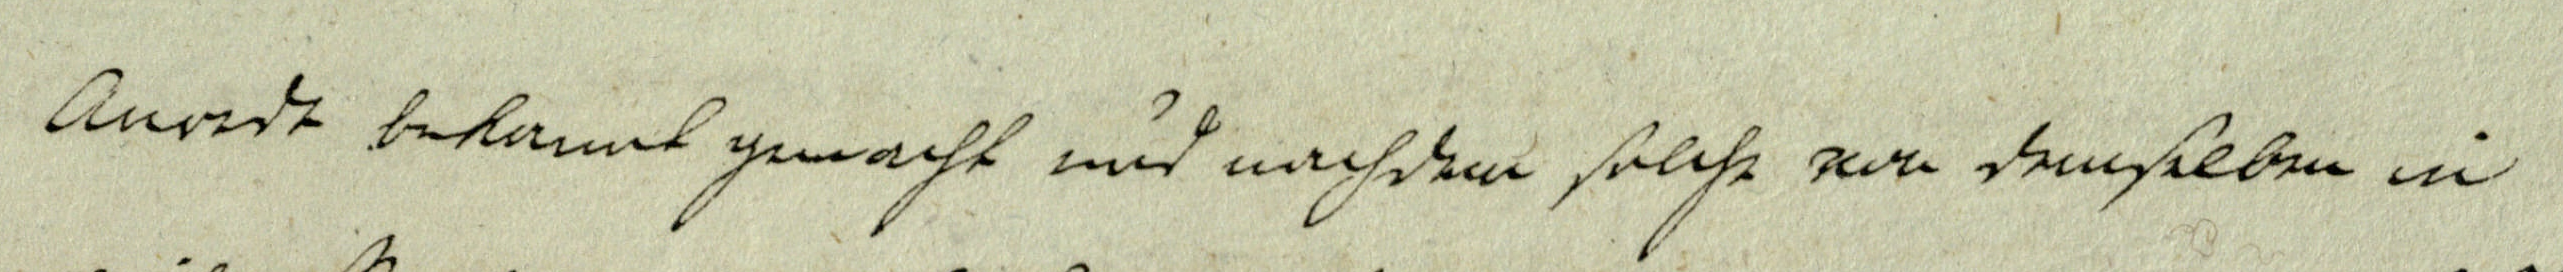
Anrede bekannt gemacht und nachdem solche von demselben in
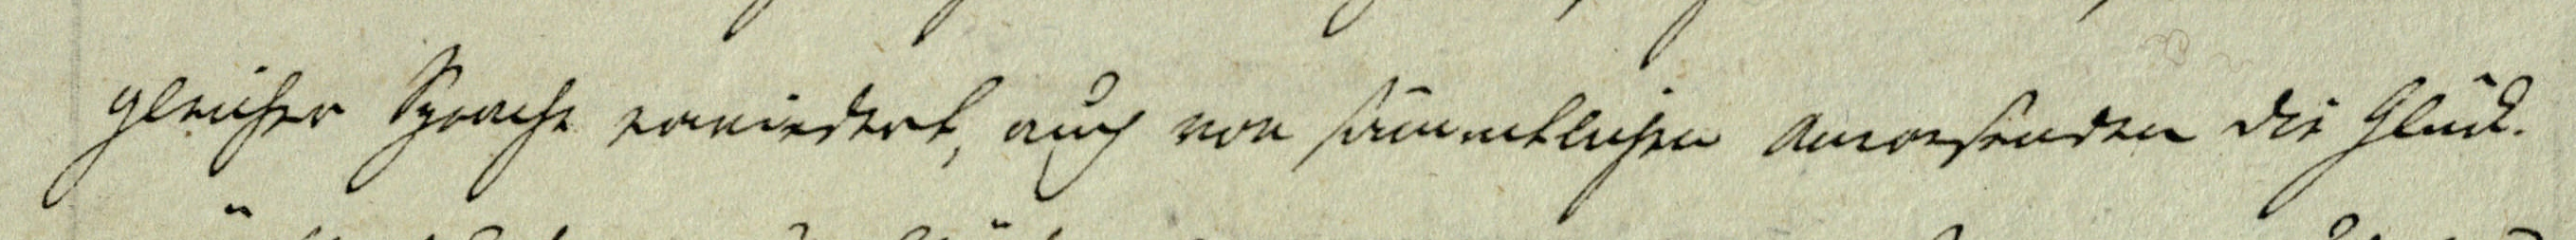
gleicher Sprache erwiedert, auch von sämmtlichen Anwesenden die Glück¬
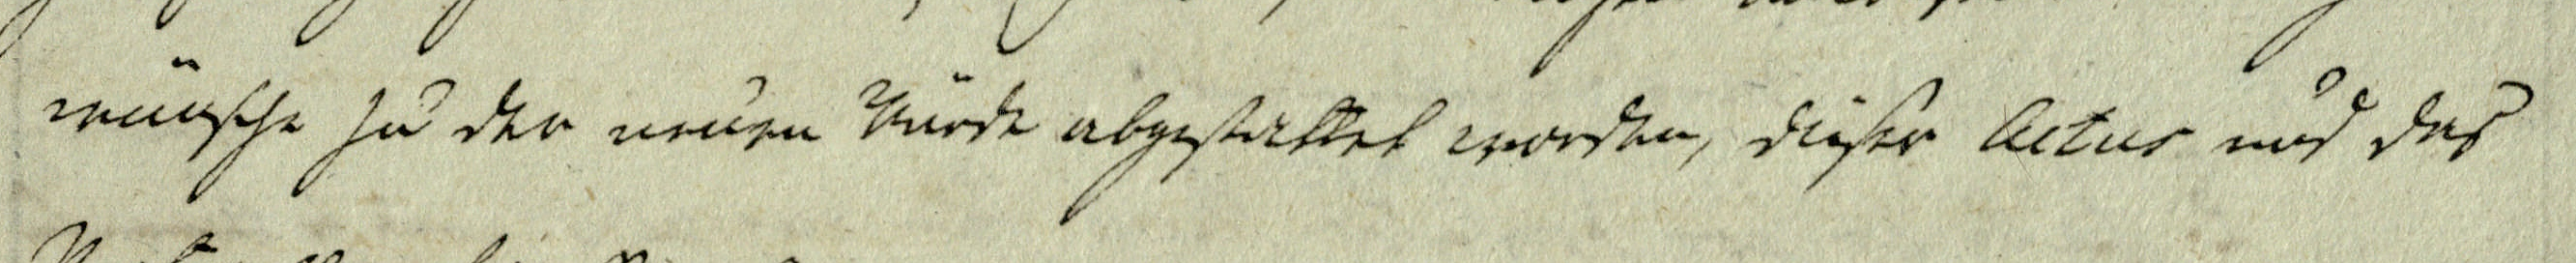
wünsche zu der neuen Würde abgestattet worden, dieser Actus und des
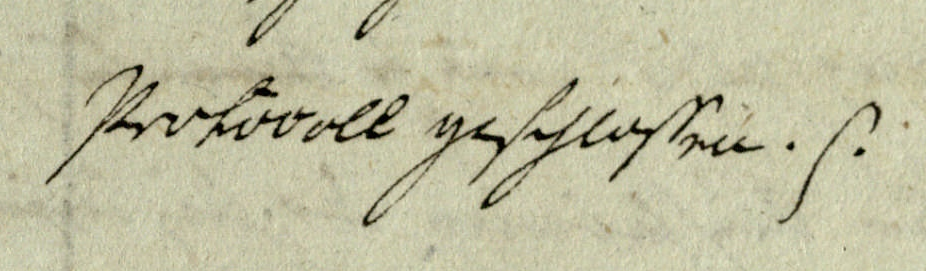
Protocoll geschlossen.s.
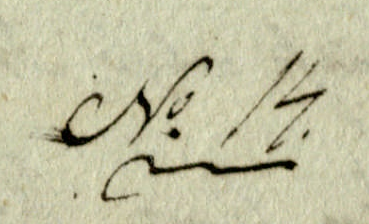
Nº 14.
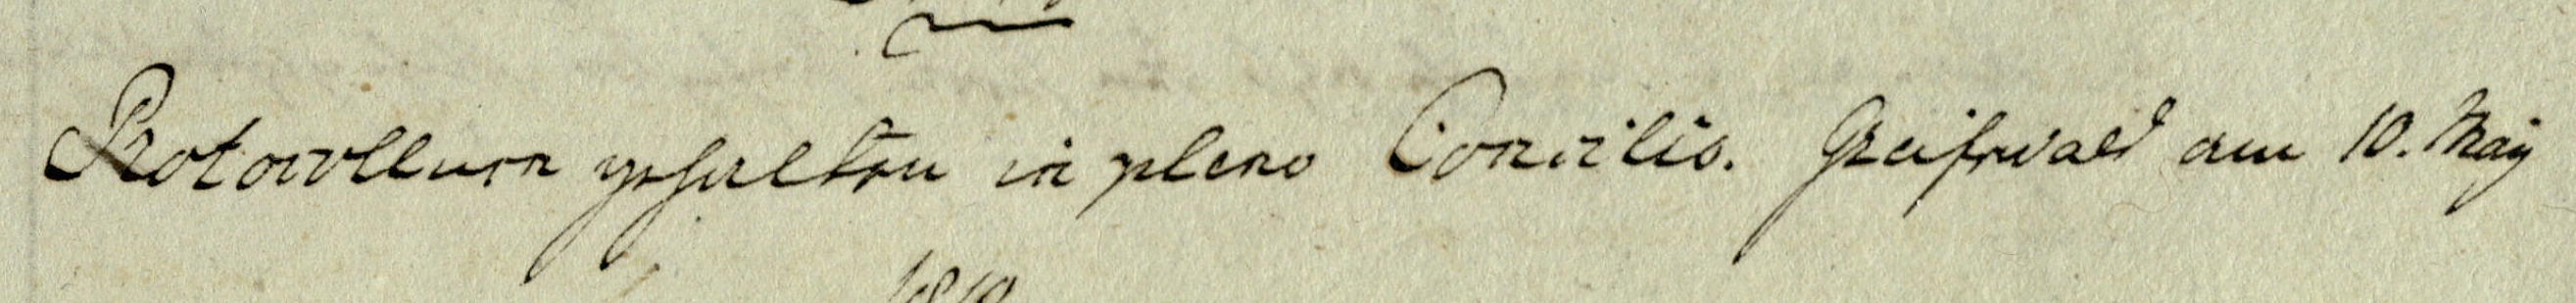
Protocollum gehalten in pleno Concilio. Greifswald am 10. Maÿ
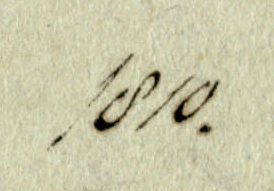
1810.
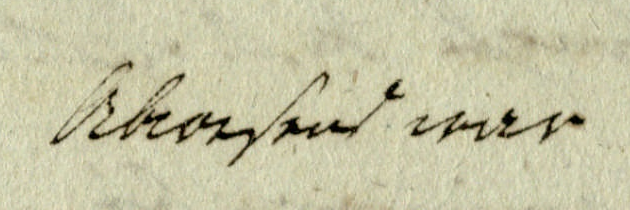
Abwesend war
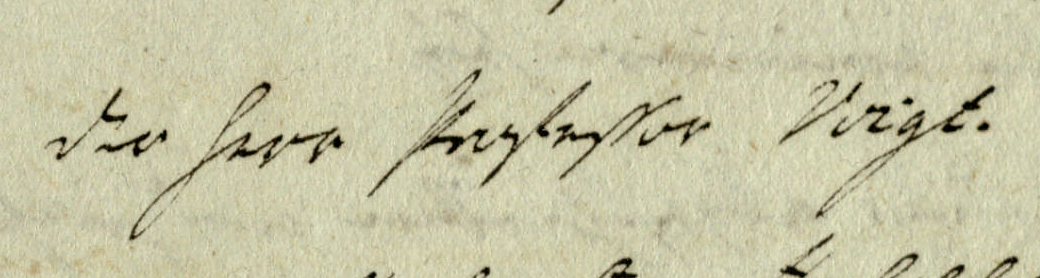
der Herr Professor Voigt.
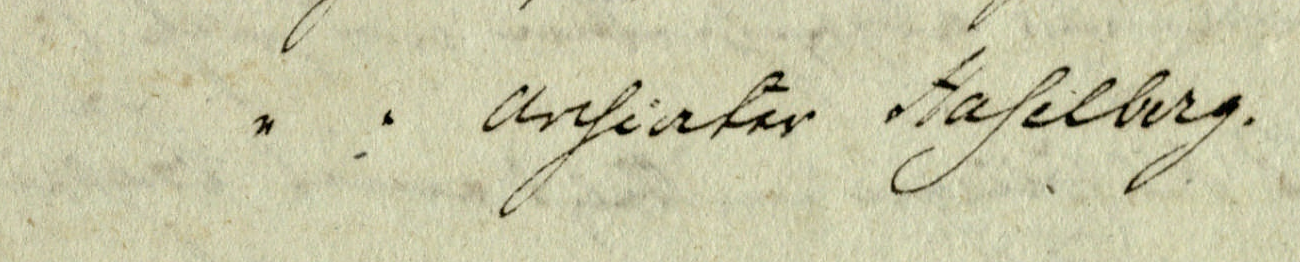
Archiater Haselberg.
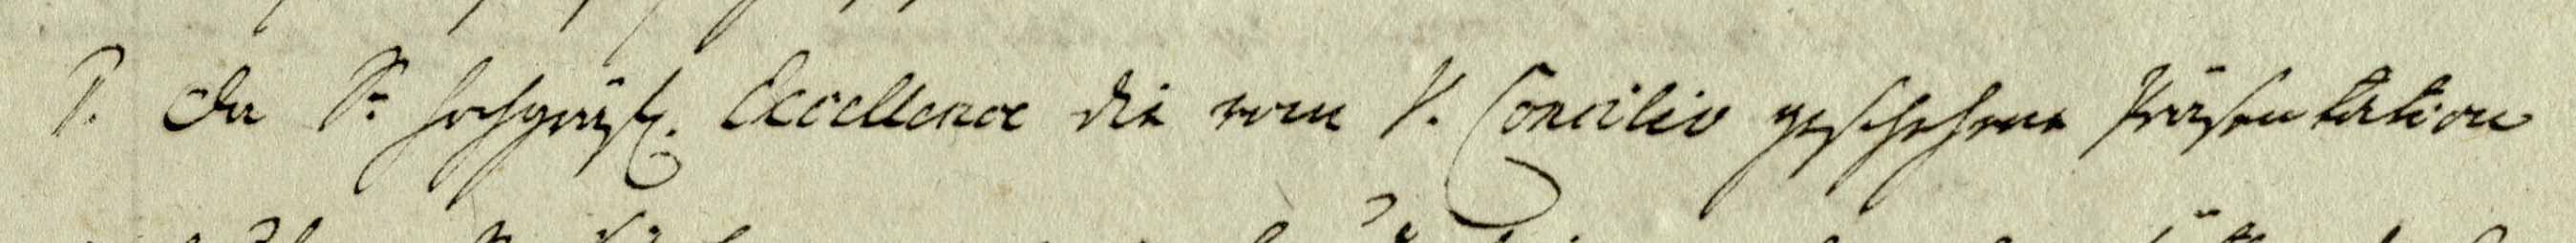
1. Da Sr Hochgräfl. Excellence die vom V. Concilio geschehene Präsentation
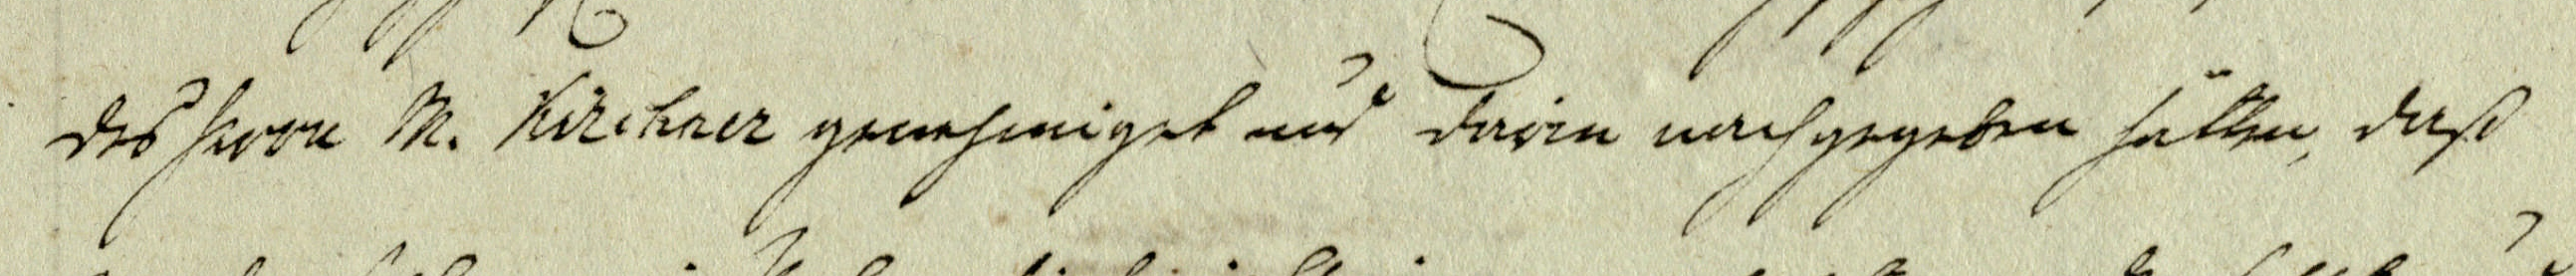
des Herrn M. Kirchner genehmiget und darin nachgegeben hätten, daß
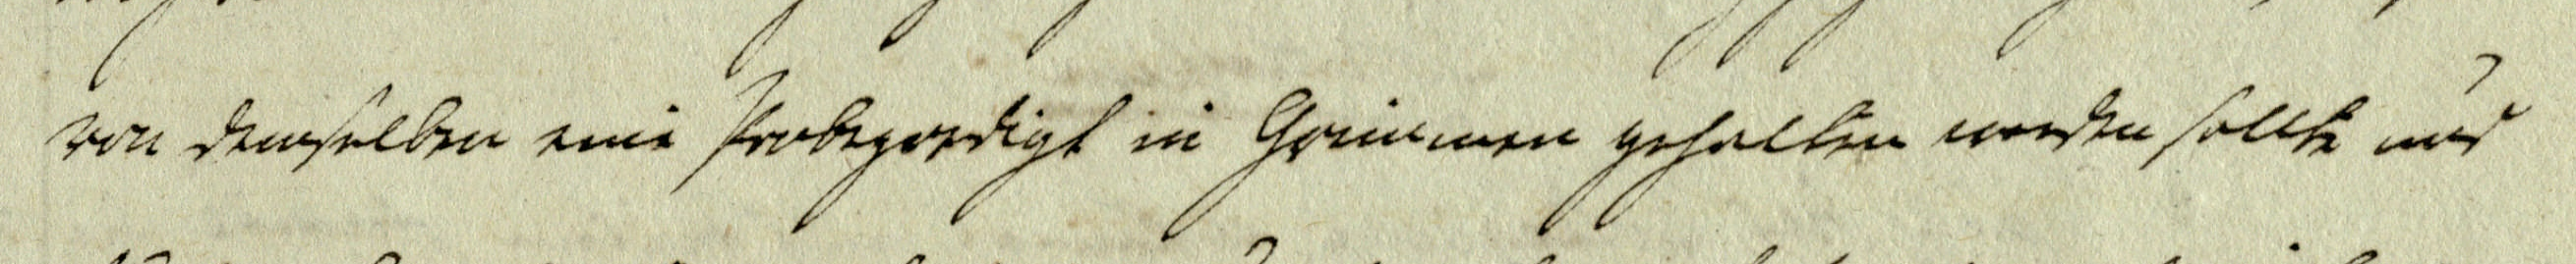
von demselben eine Probepredigt in Grimmen gehalten werden sollte und
